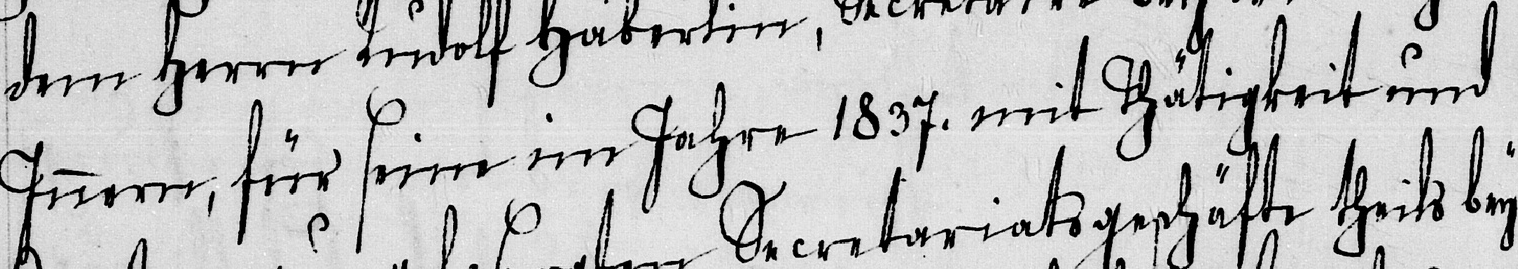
Innern, für seine im Jahr 1837. mit Thätigkeit und
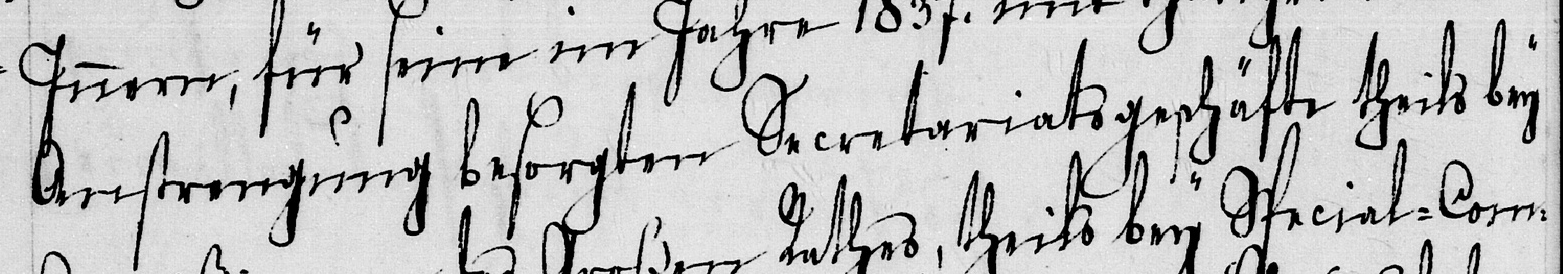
Anstrengung besorgten Secretariatsgeschäfte theils bey
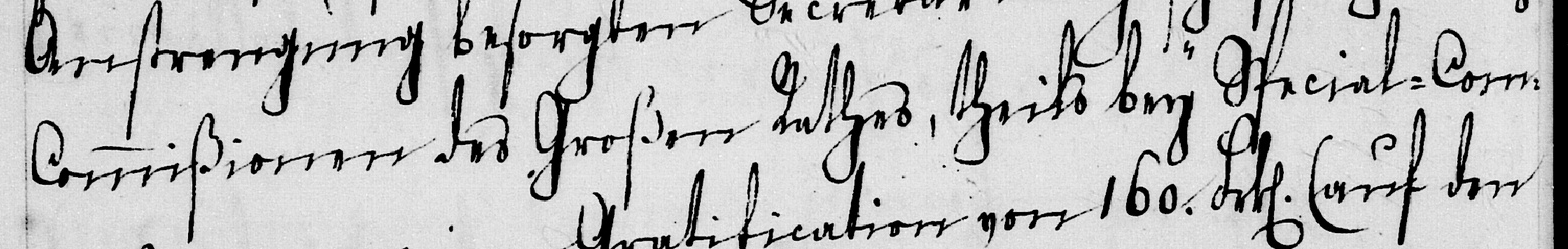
Commißionen des Großen Rathes, theils bey Special-Com¬
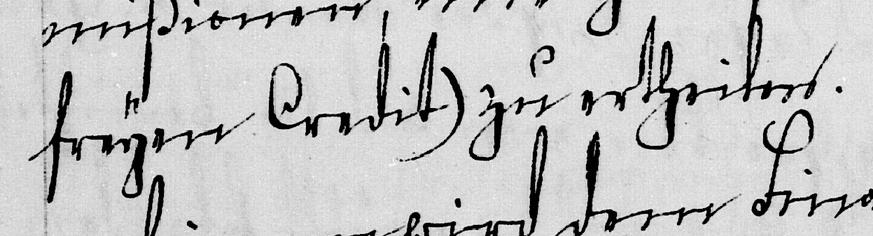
freyen Credit) zu ertheilen.
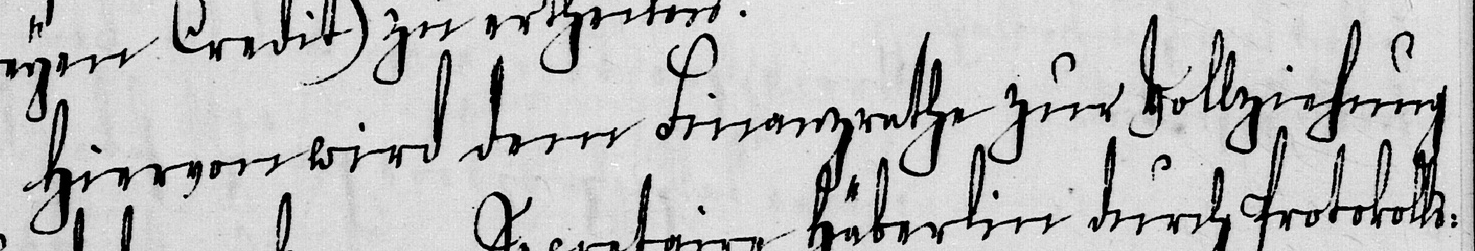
Hiervon wird dem Finanzrathe zur Vollziehung
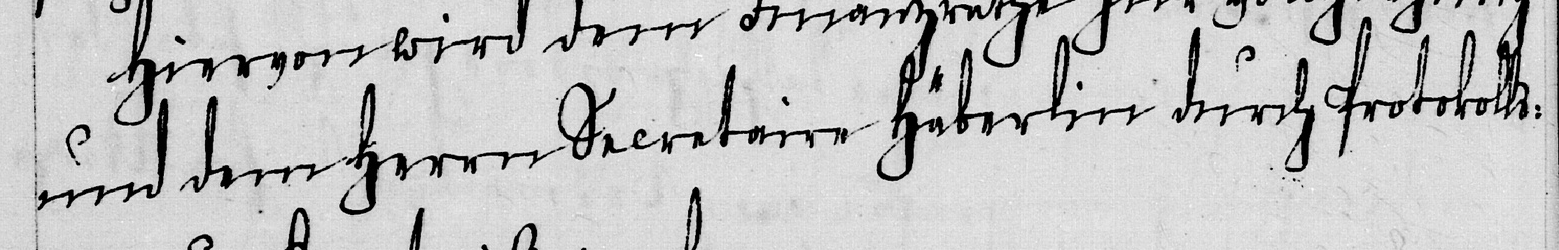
und dem Herrn Secretaire Häberlin durch Protokol¬
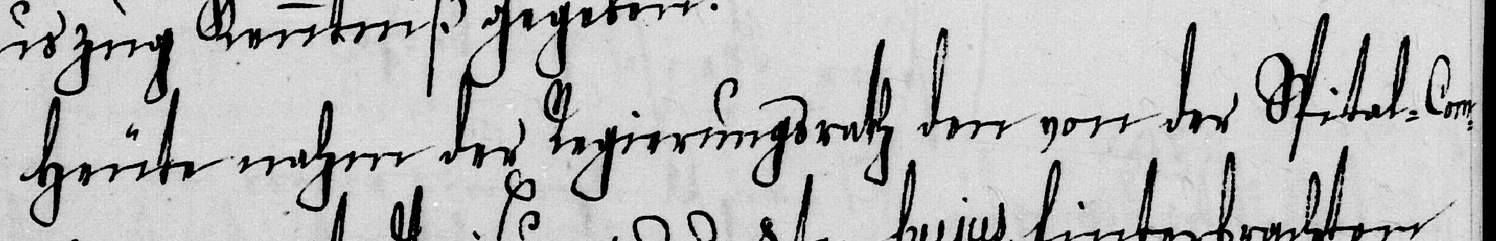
Heute nahm der Regierungsrath den von der Spital-Co¬
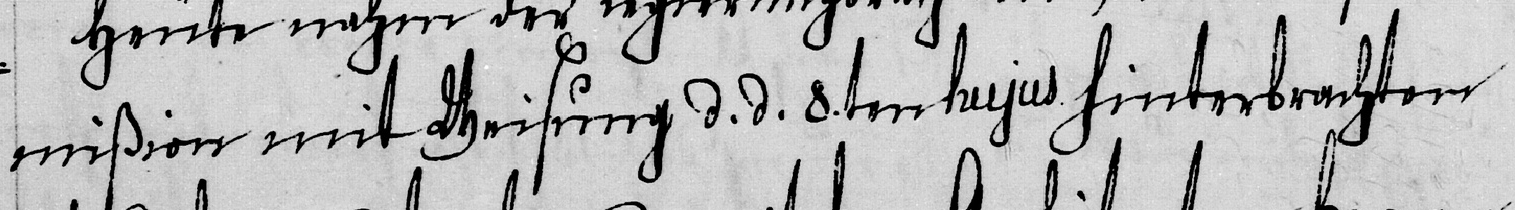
mmißion mit Weisung d. d. 8.ten hujus hinterbrachten
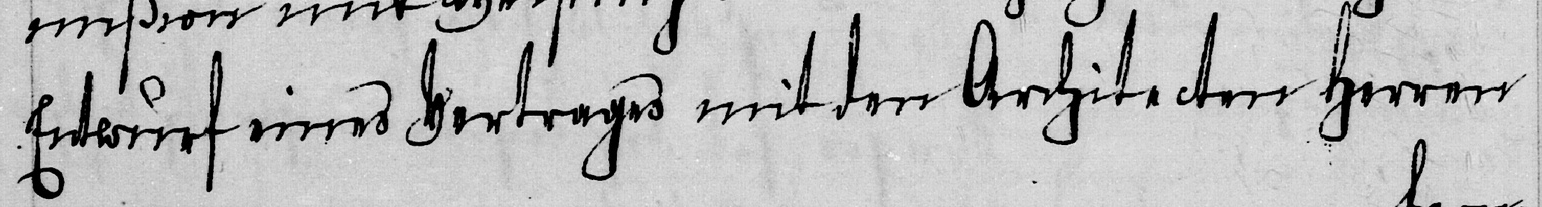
Entwurf eines Vertrags mit den Architecten Herren
